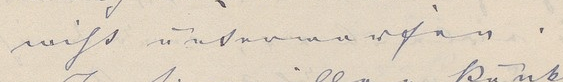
nicht unterwerfen.
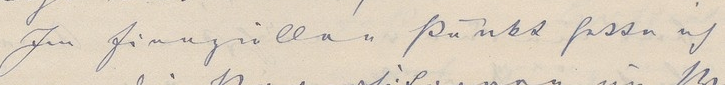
Im finanziellen Punkt hätte ich
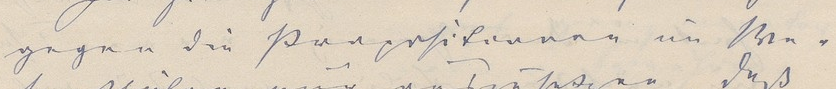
gegen die Propositionen im We-
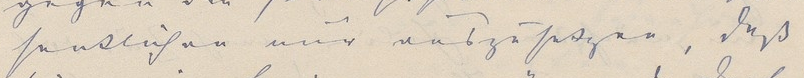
sentlichen nur auszusetzen, daß
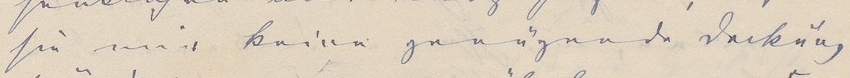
sie mir keine genügende Deckung
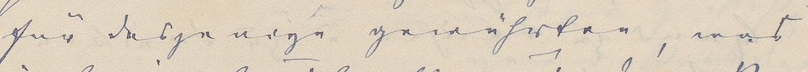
für dasjenige gewährten, was
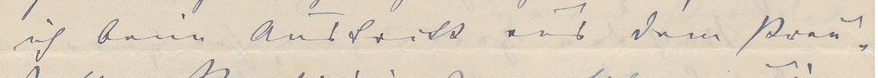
ich beim Austritt aus dem Preu-
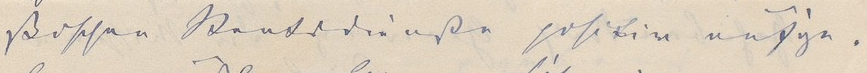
ßischen Staatsdienste positiv aufge-
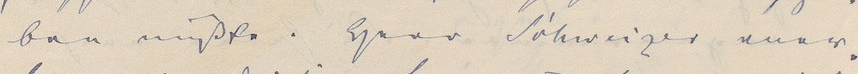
ben müßte. Herr Schweizer aner-
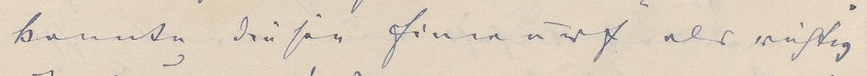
kannte diesen Einwurf als richtig
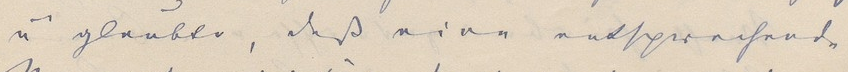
u glaubte, daß eine entsprechende
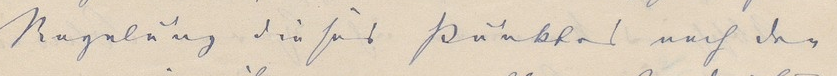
Regelung dieses Punktes nach den
